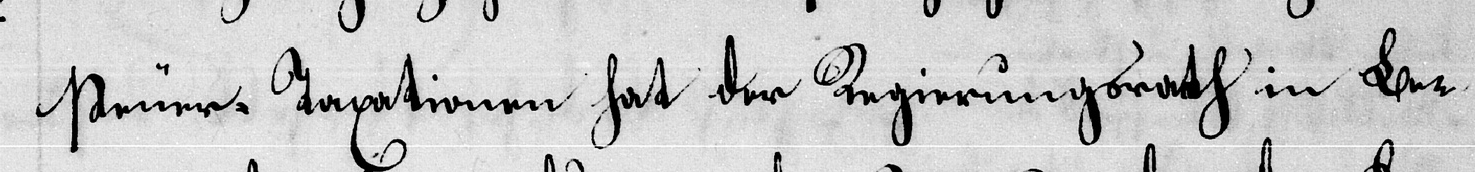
steuer-Taxationen hat der Regierungsrath in Be¬
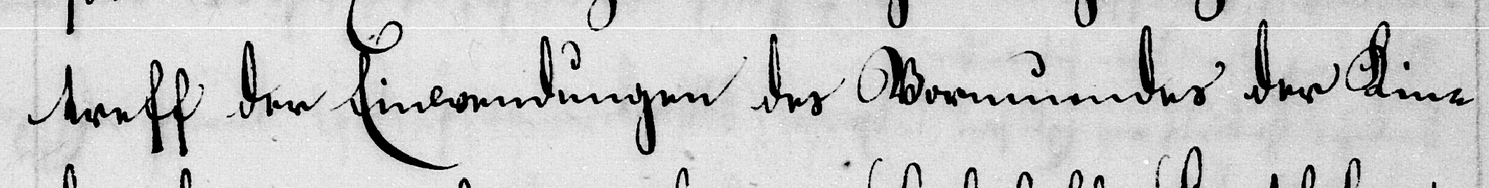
treff der Einwendungen des Vormundes der Kin¬
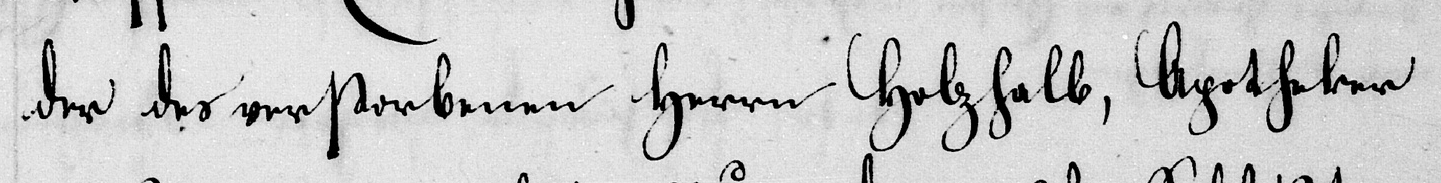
der des verstorbenen Herrn Holzhalle, Apotheker
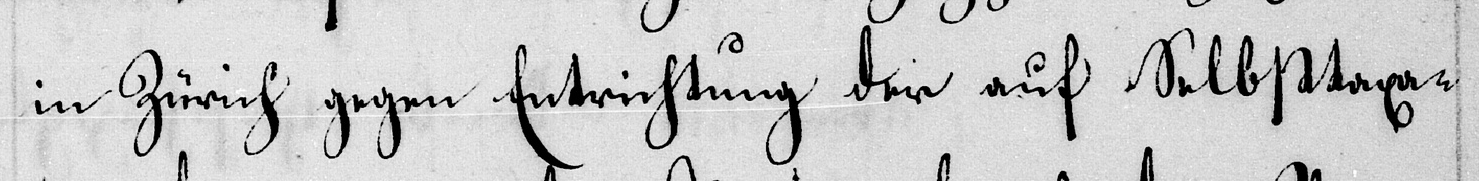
in Zürich gegen Entrichtung der auf Selbsttaxa¬
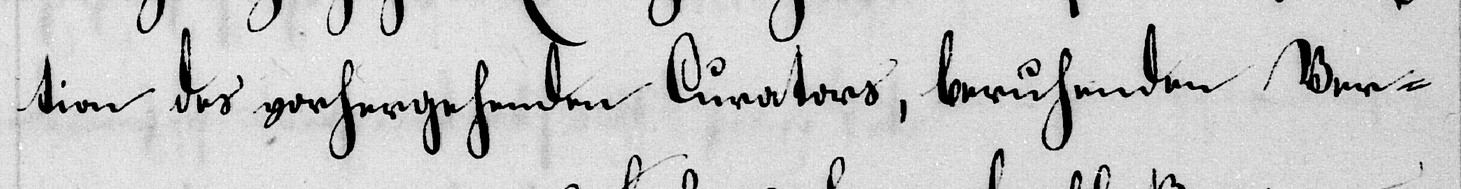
tion des vorhergehenden Curators, beruhenden Ver¬
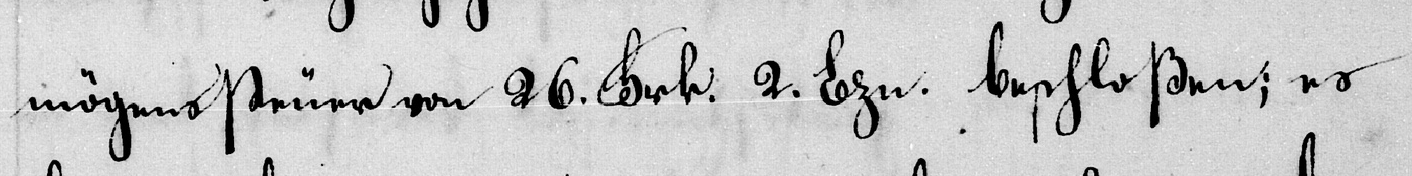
mögenssteuer von 26. Frk. 2. Bzn. beschloßen; es
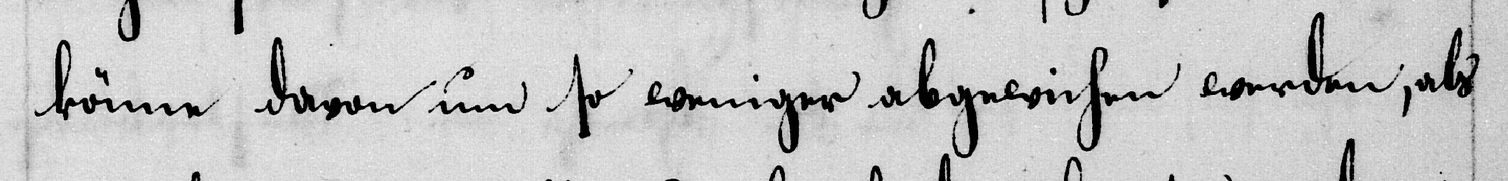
könne davon um so weniger abgewiesen werden, als
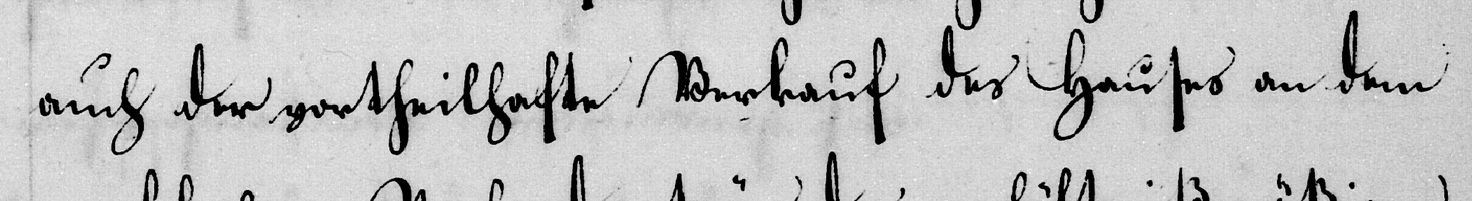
auch der vortheilhafte Verkauf des Hauses an dem
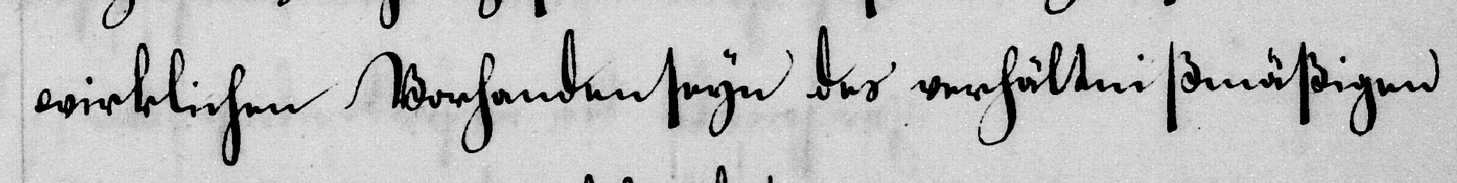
wirklichen Vorhandenseyn des verhältnißmäßigen
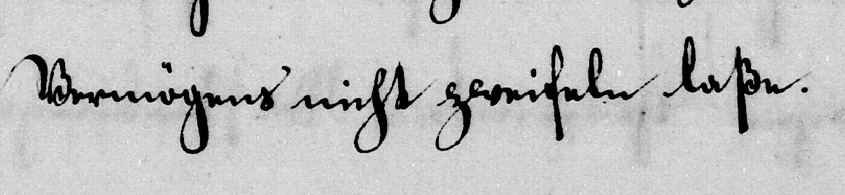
Vermögens nicht zweifeln laße.
